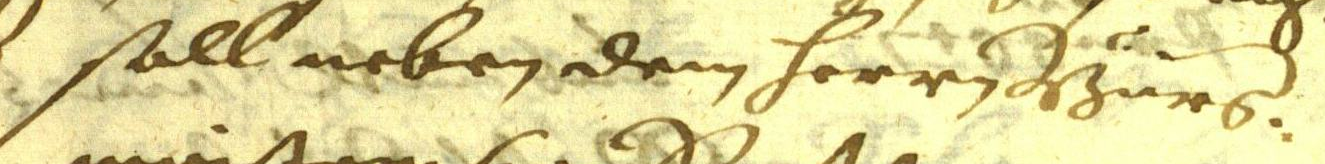soll neben dem herrn Būrg¬
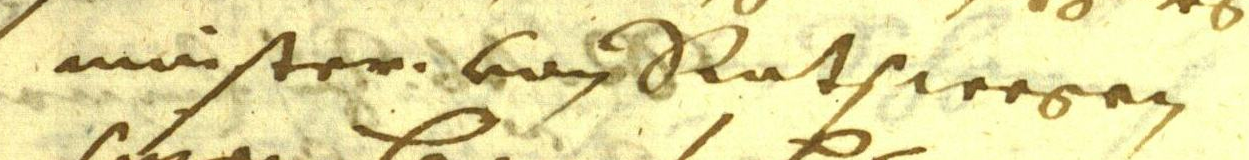maister. von Ratswegen
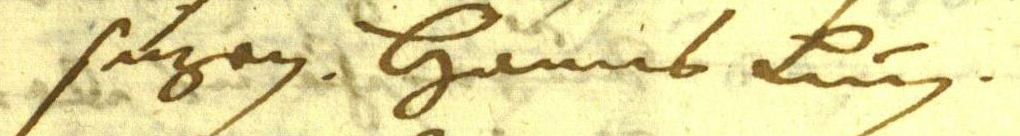sizen. Hanns Lūn.
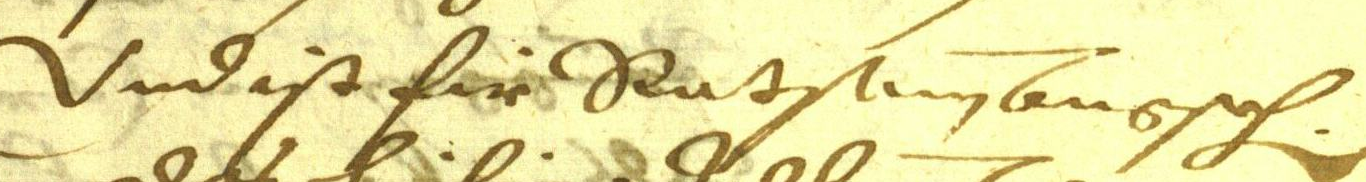Vnd ist fir Ratsam Angseh.
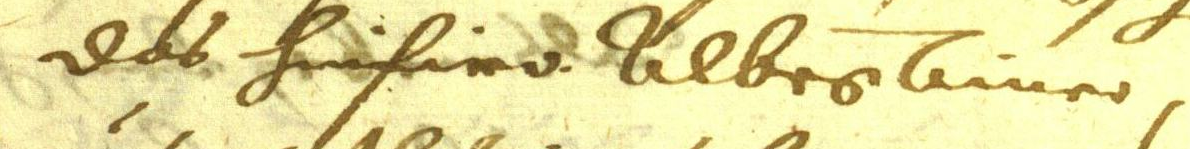das hinfiro. Albeg Ainer,
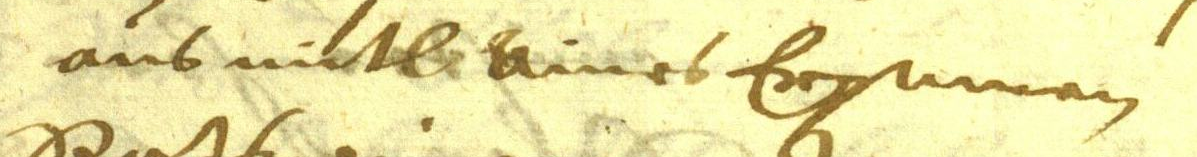aūs mitl Aines Ersamen
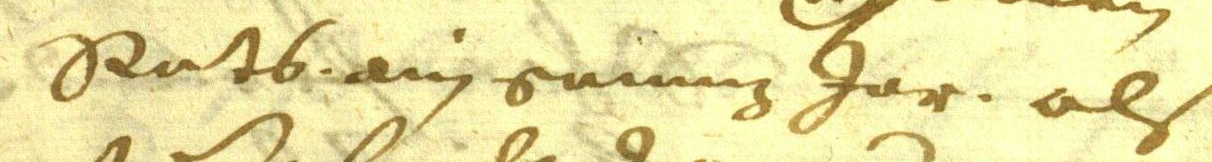Rats. ain gannz Jar. als
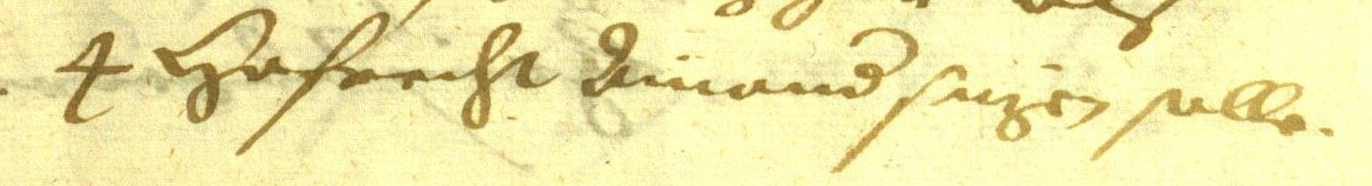4 Hofrecht Ainand sizen solle.
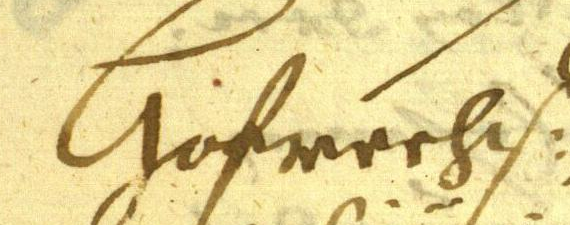Hofrecht¬
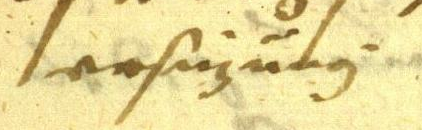ersizūng.
